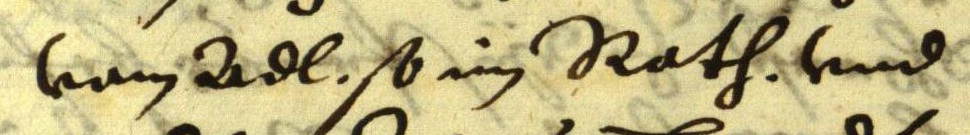vom Adl. so im Rath. vnd
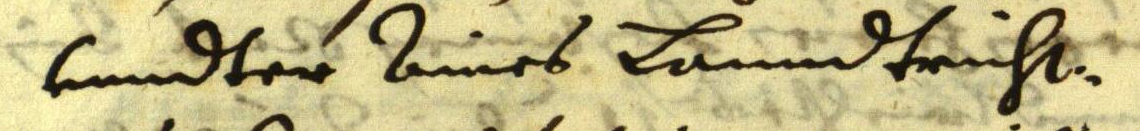vndter Aines Lanndtricht¬
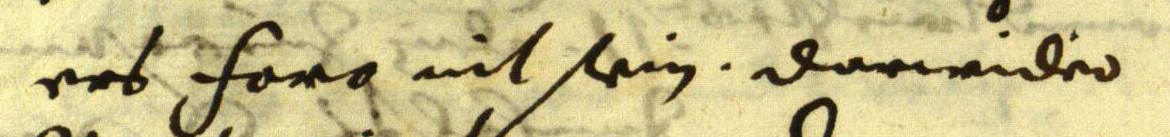ers foro nit sein. darwider
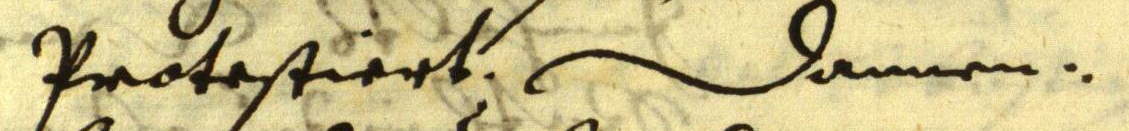Protestiert. Dannen¬
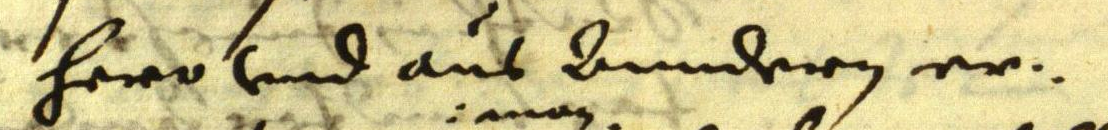hero vnd aūs Anndern er¬
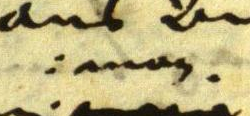:man
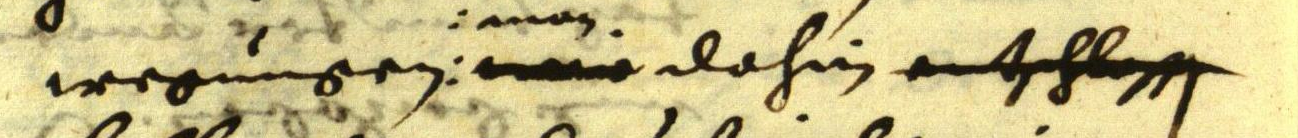wegūngen: wie dahin entschlossen
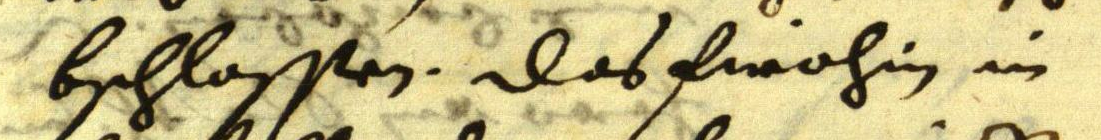bschlossen. das firohin in
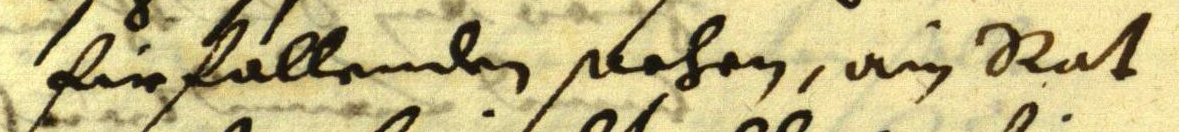fir fallenden sachen, ain Rat
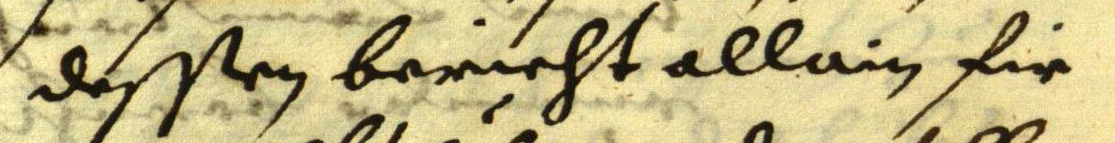dessen bericht allain fir
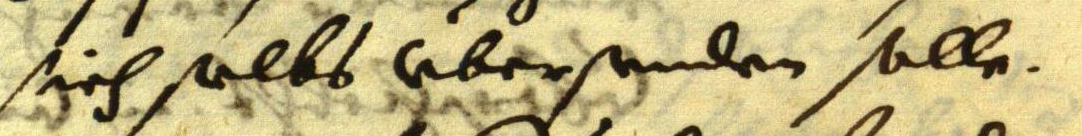sich selbs v̄bersenden solle.
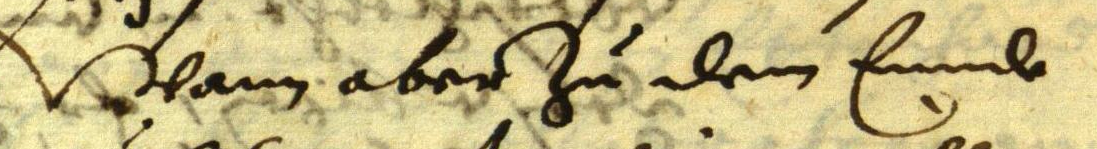Wann aber Zū dem Ennde
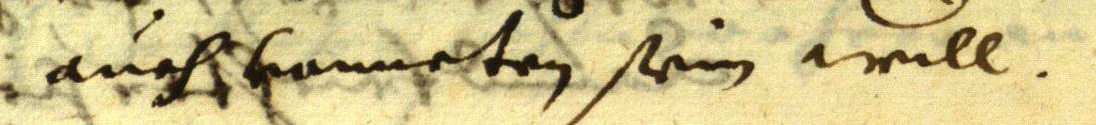aūch vonneten sein will.
